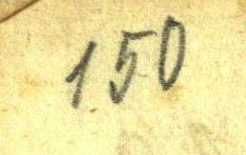150
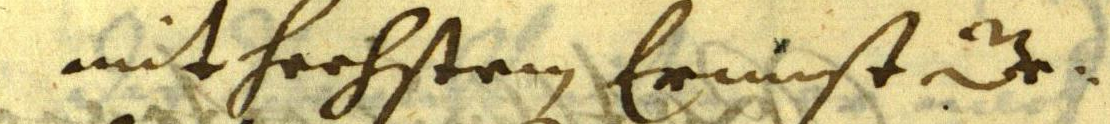mit hechstem Ernnst Ge¬
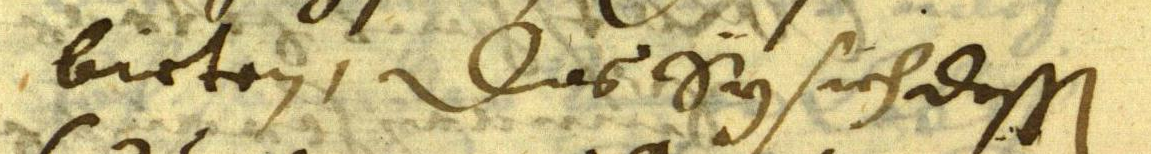bieten, das Sÿ sich dess
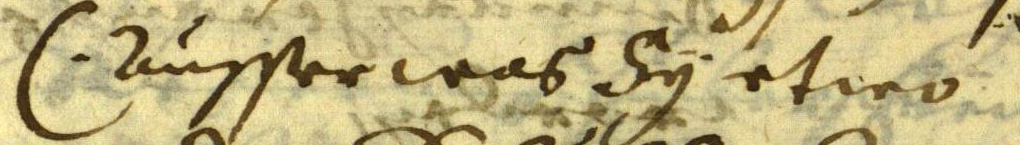(.aūsser was Sÿ etwa
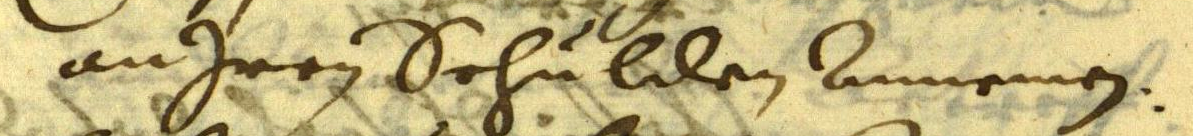an Iren Schūlden Annemen¬
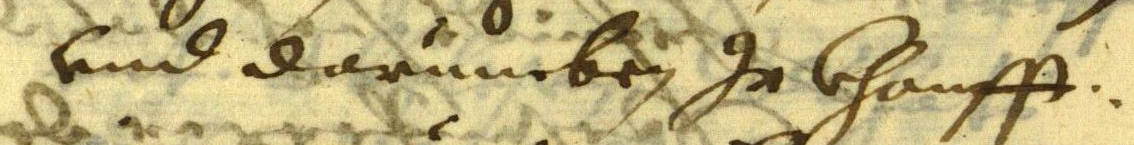vnd darūmben Ir khonnfft¬
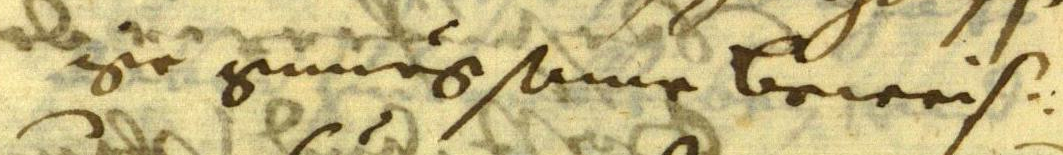ige gnūegsame beweis¬
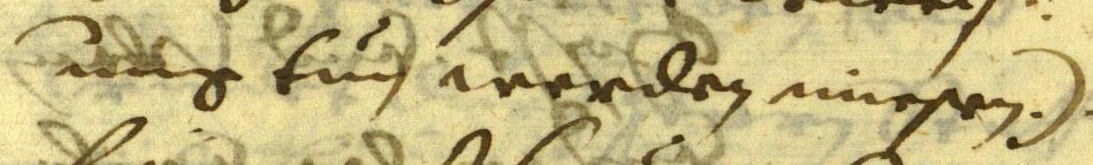ūng tūn werden miesen.).
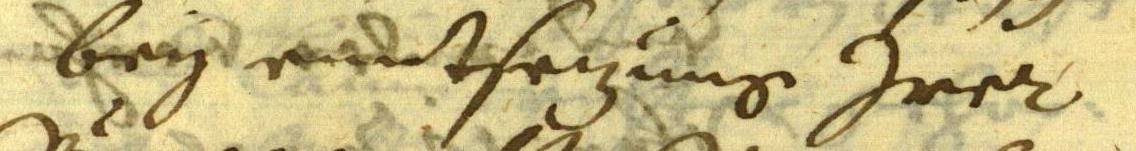beÿ enntsezūng Irer
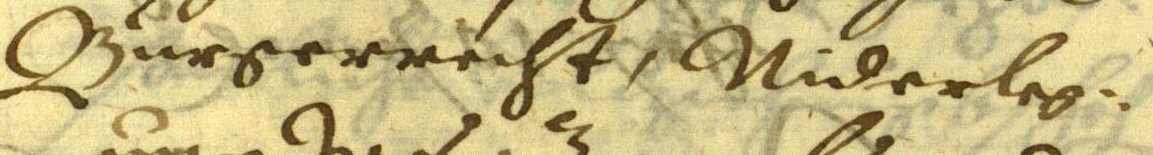Būrgerrecht, Niderleg¬
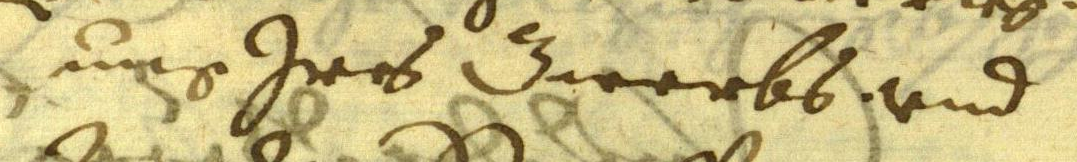ūng Ihres Gwerbs. vnd
